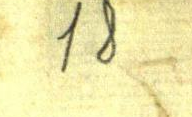18
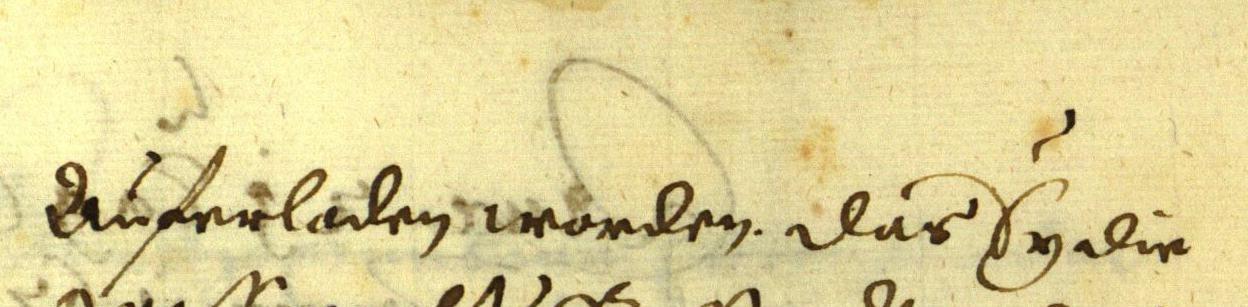Aūferladen worden, das Sȳ die
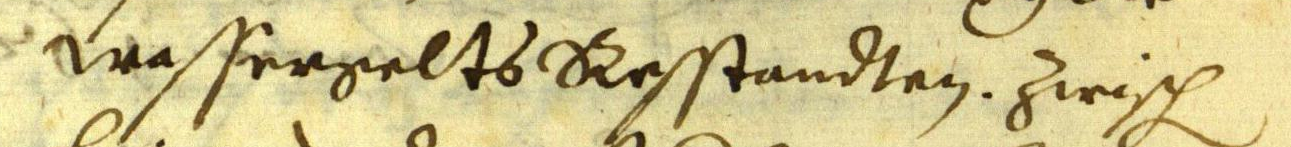Wassergelts Resstandten. Zwisch
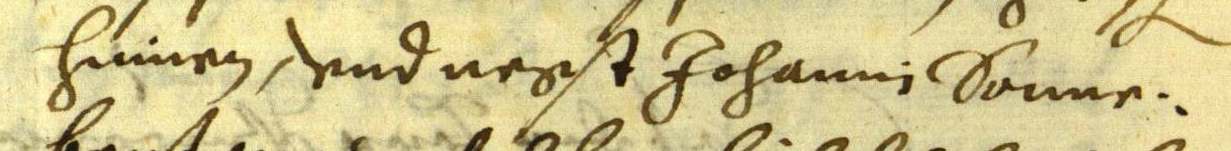hinnen, vnd negst Johanni Sonne¬
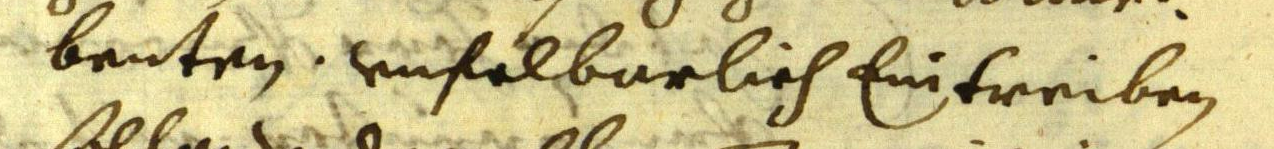benten. unfelbarlich Eintreiben
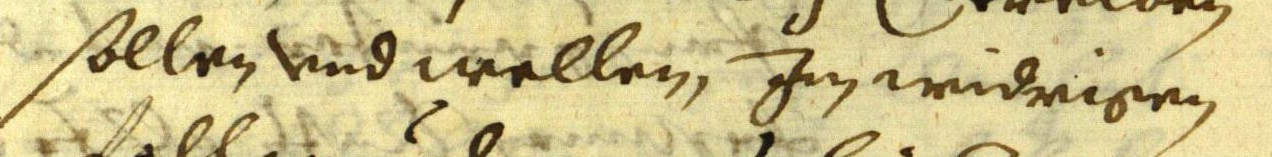sollen vnd wellen, Im widrigen
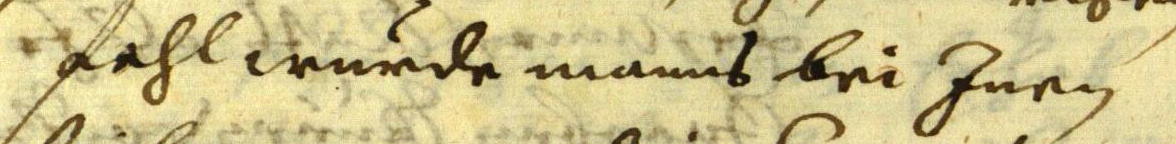fahl wūrde mans bei Inen
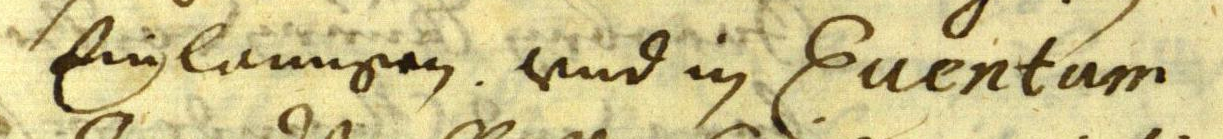Einlanngen. vnd in Euentum
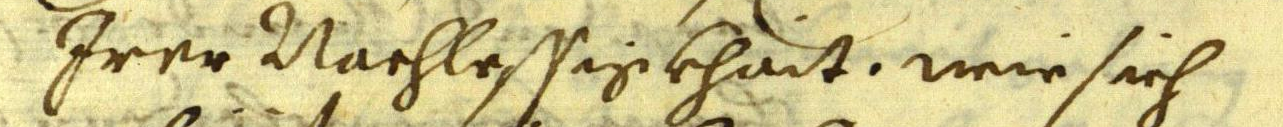Irer Nachlessigkhait. wie sich
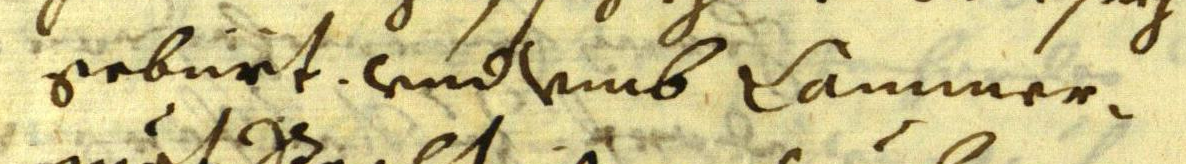gebürt. vnd vmb Cammer¬
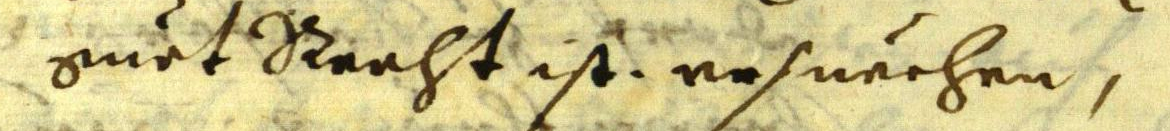gūet Recht ist. ersūechen,
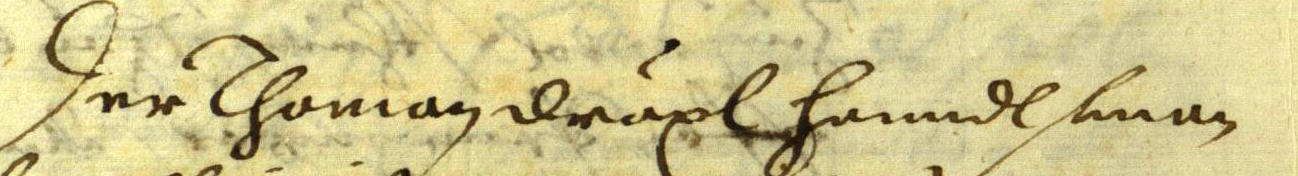Der Thoman drāxl Hanndlsman
